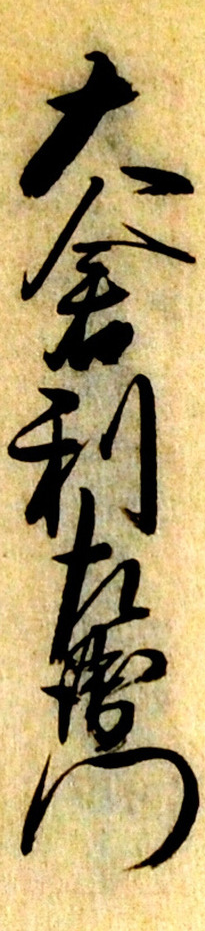大倉利左衛門
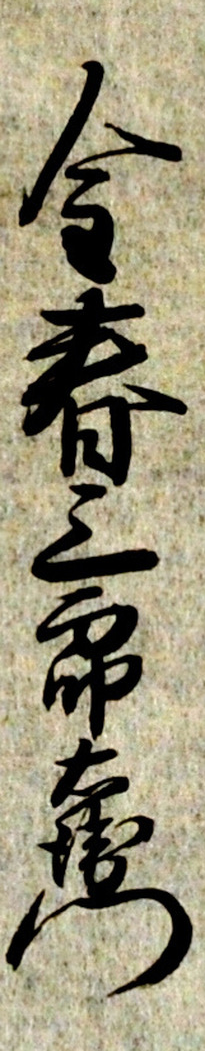金春三郎右衛門
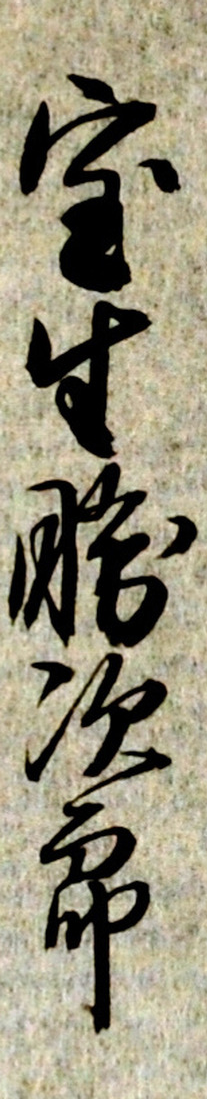宝生勝次郎
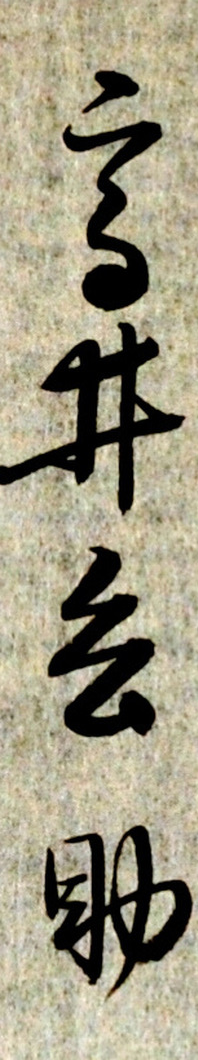高井兵助
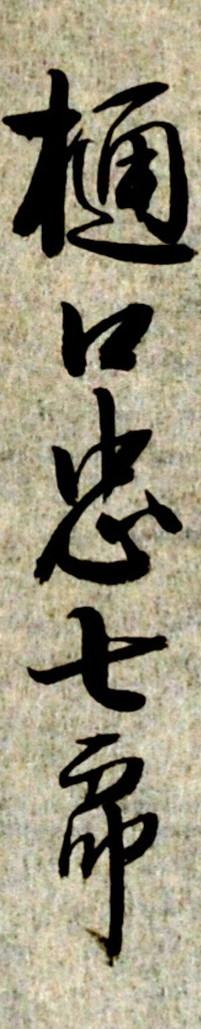樋口忠七郎
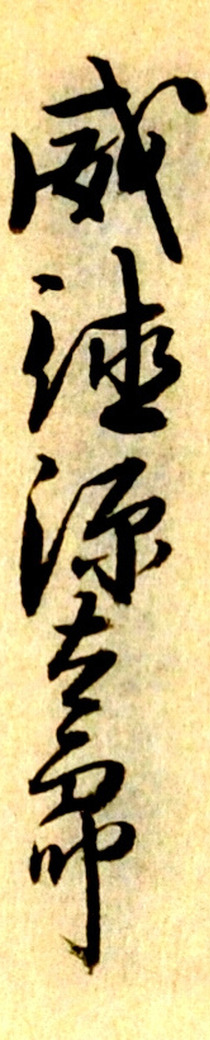威德源太郎

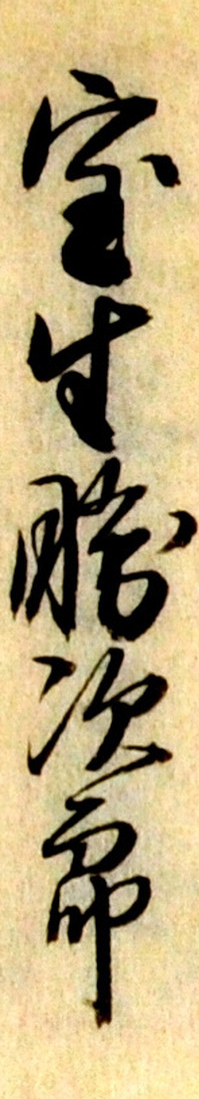宝生勝次郎
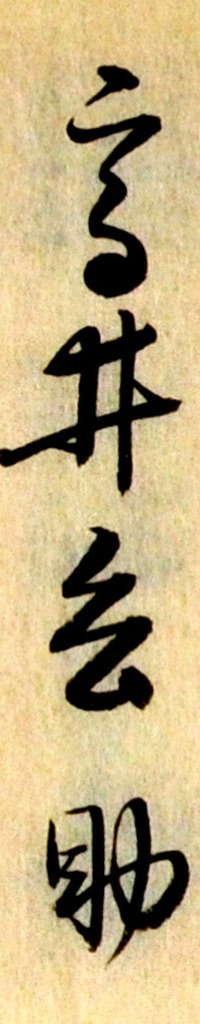高井兵助
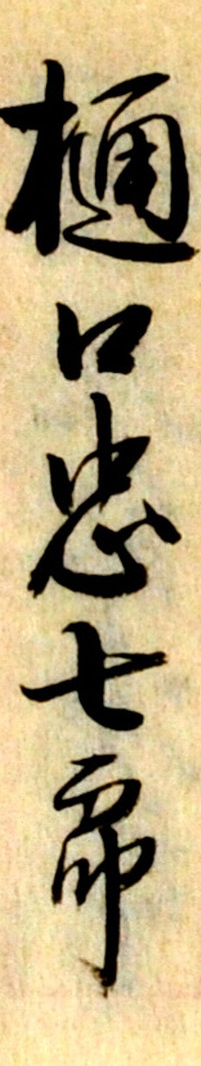樋口忠七郎
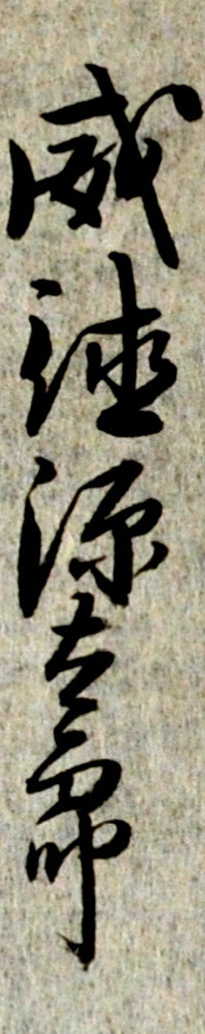威德源太郎
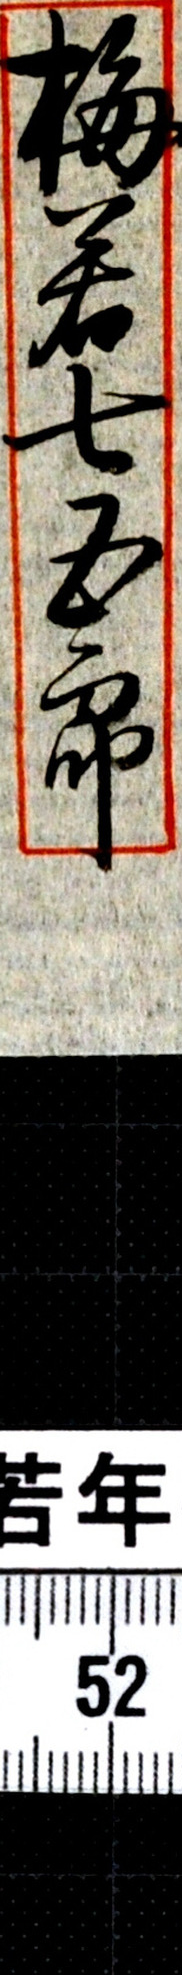「梅若七五郎」
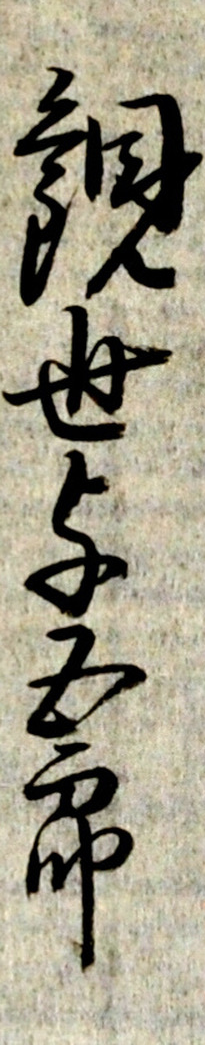観世与五郎
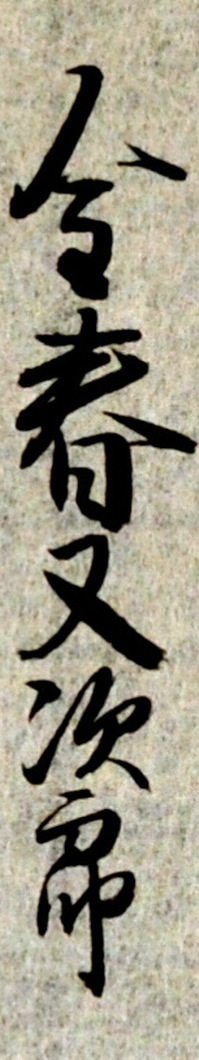金春又次郎
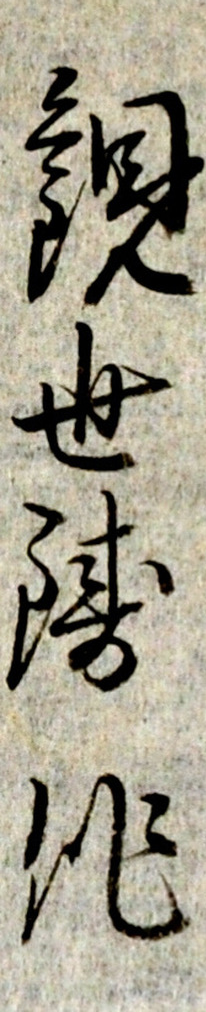観世銭作
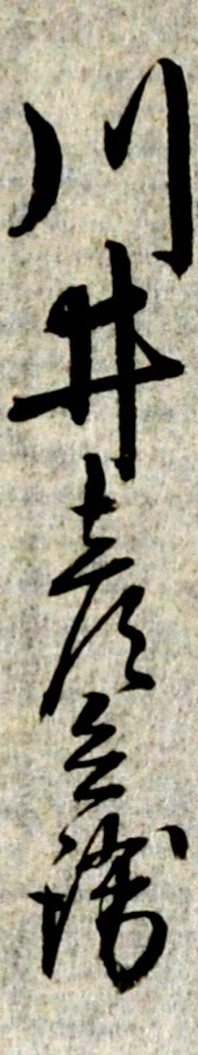川井彦兵衛
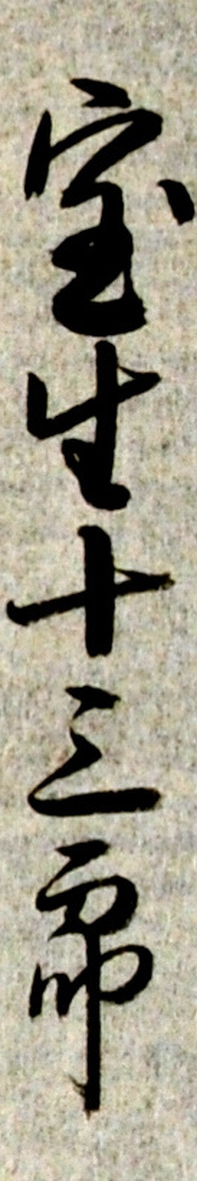宝生十三郎
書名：若年寄御役中御調書付
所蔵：伊那市立高遠町図書館・合同会社AMANE
